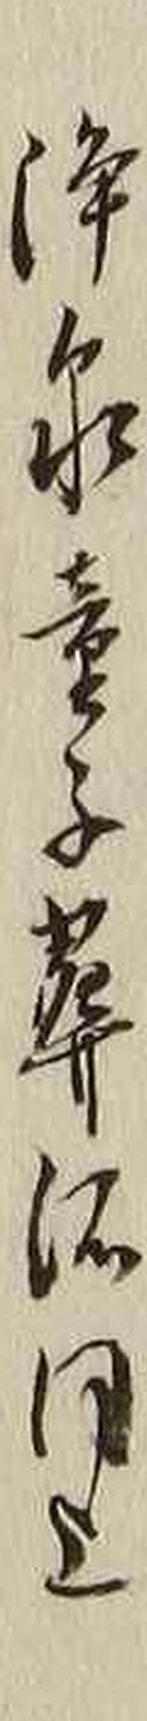浄泉童子葬所同上
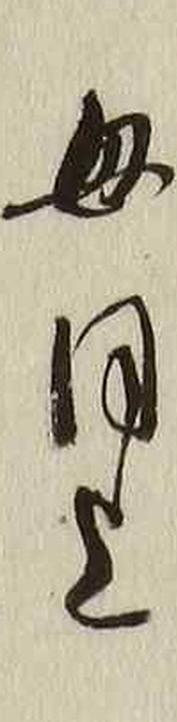母同上
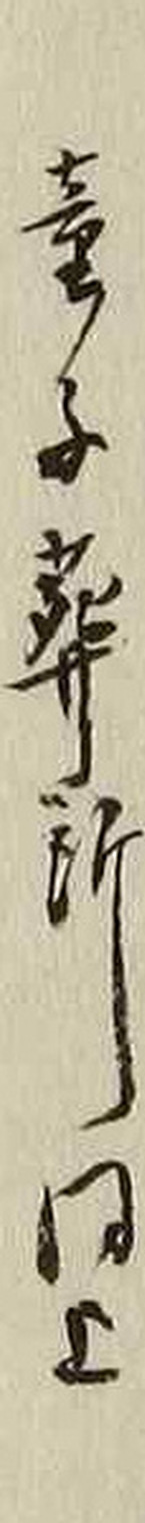童子葬所同上
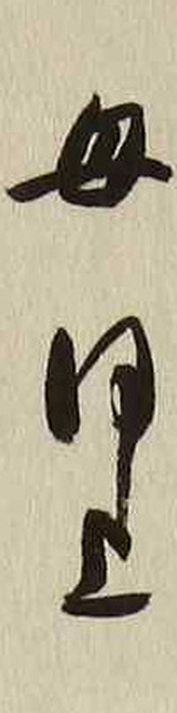母同上
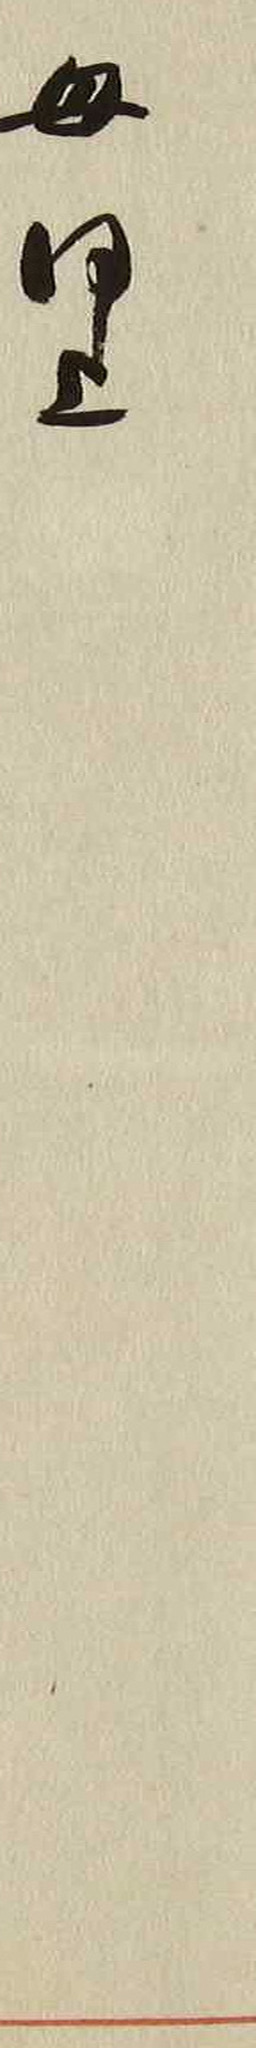母同上
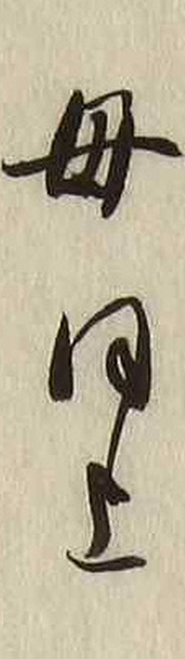母同上
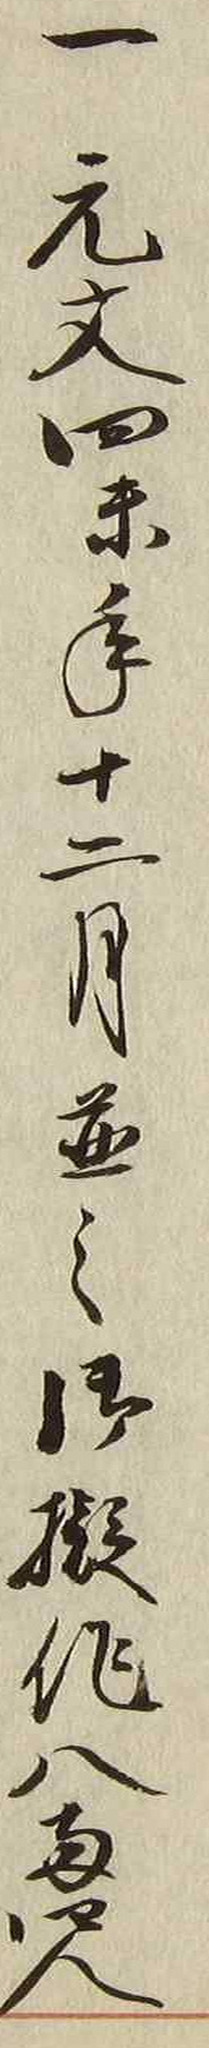一元文四未年十二月並之御擬作八両四人
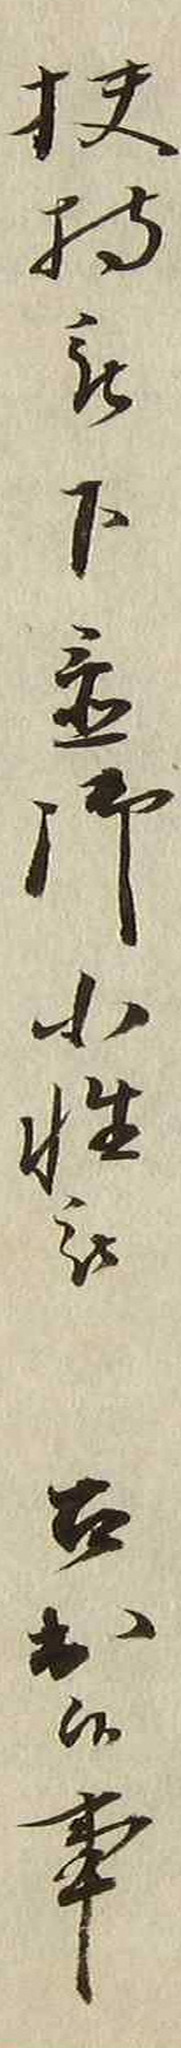扶持被下置御小性被召出候事
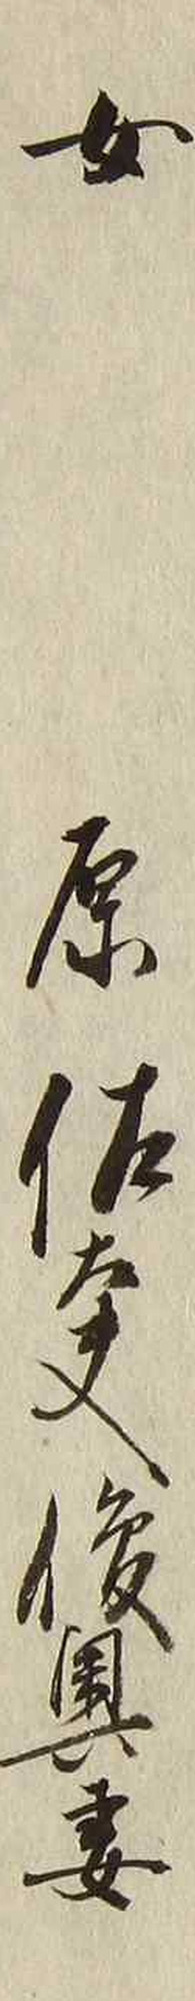女原佐大夫俊具奥妻
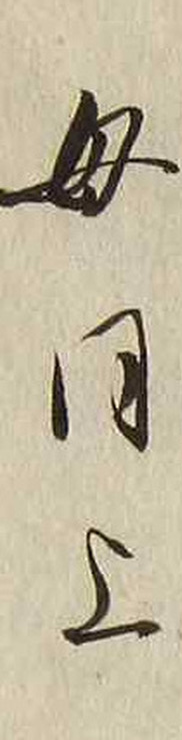母同上

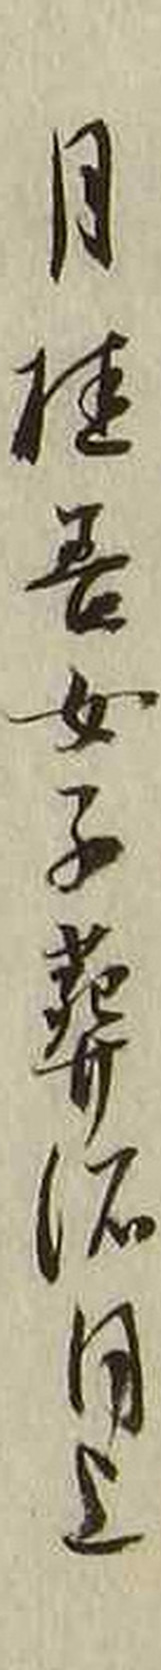月桂善女子葬所同上
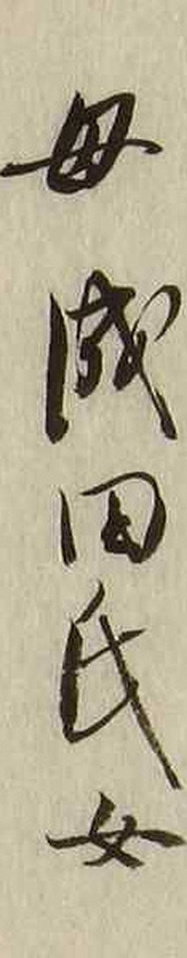母成田氏女
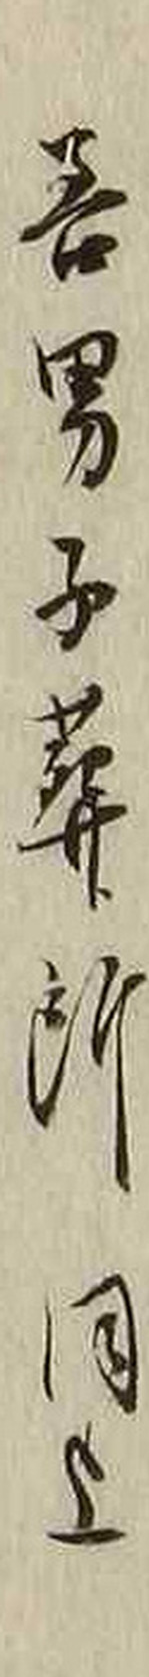善男子葬所同上
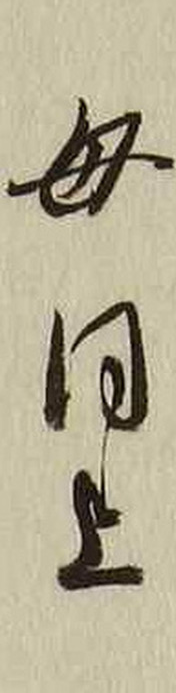母同上
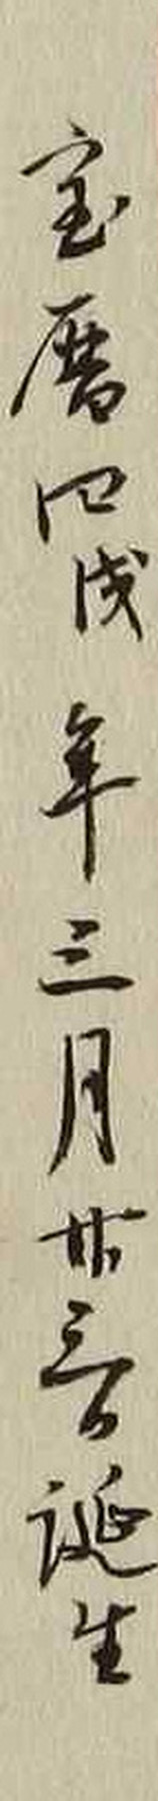宝暦四戌年三月廿三日誕生
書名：諸士系譜　巻之22　い之部22
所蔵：会津若松市立会津図書館
